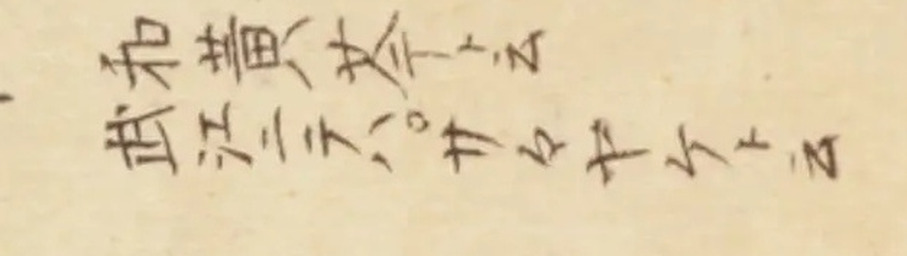武江ニテハ。サ々ヤケト云
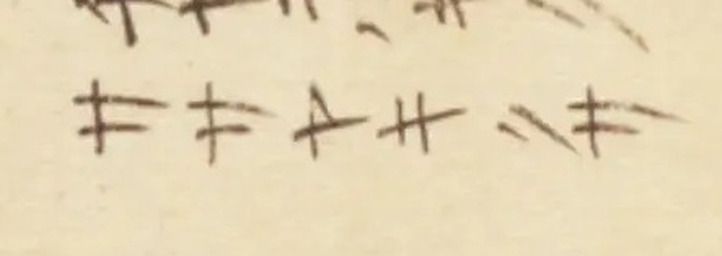ササヤキクサ
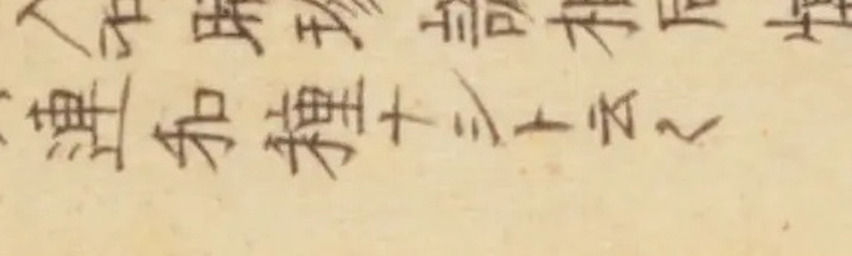黄連和種ナシト云々
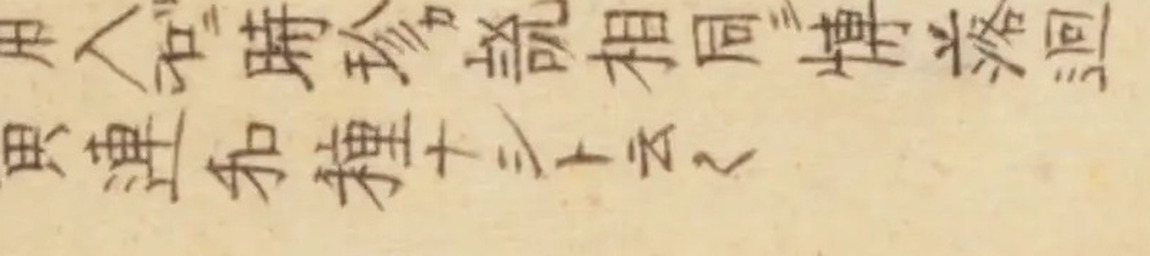黄連和種ナシト云々
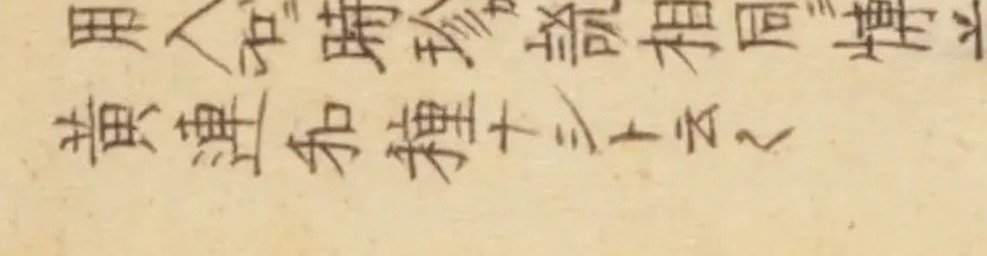黄連和種ナシト云々
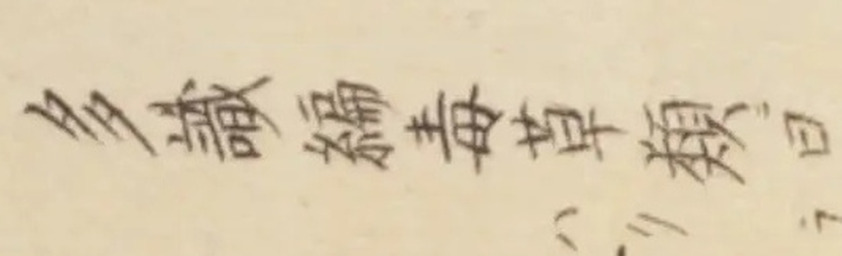多識編毒草類曰
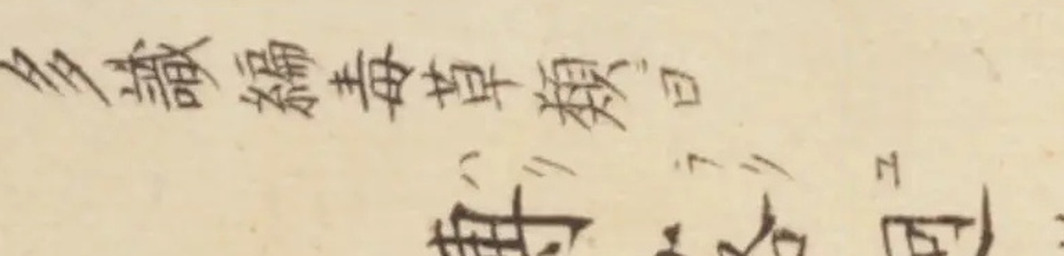多識編毒草類曰
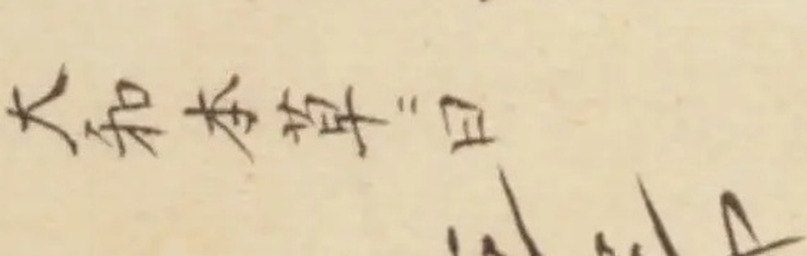大和本草曰
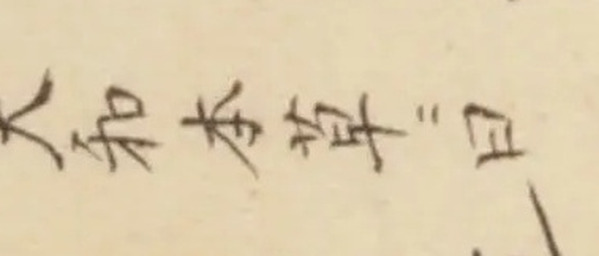大和本草曰
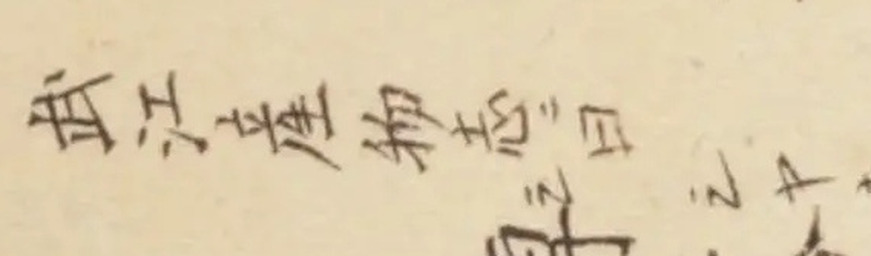武江産物志ーニ曰

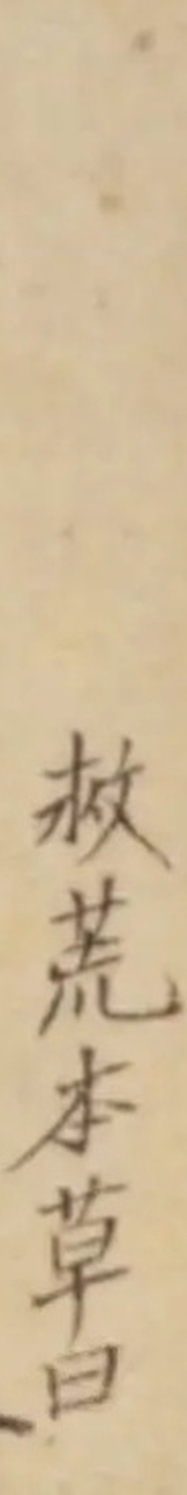救荒本草曰
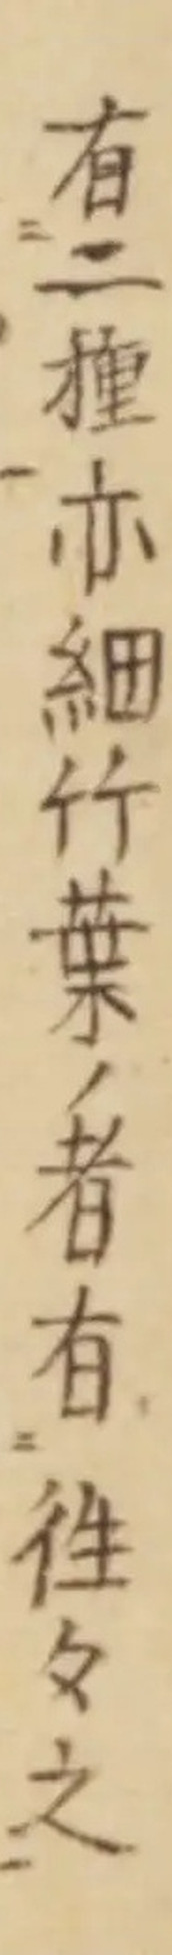有二種亦細竹葉ノ者有往々之
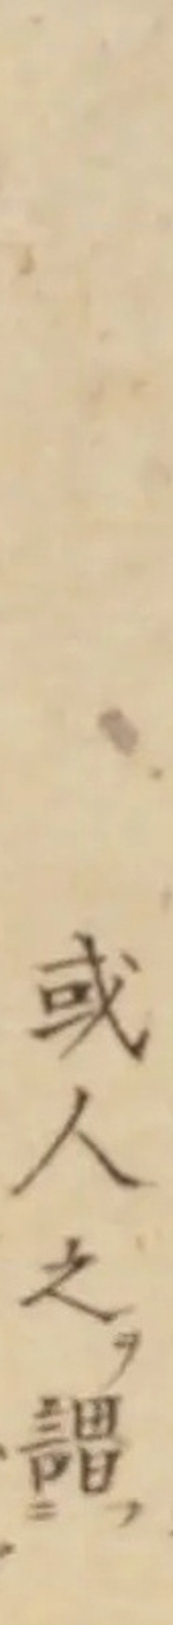或人之ヲ謂フ
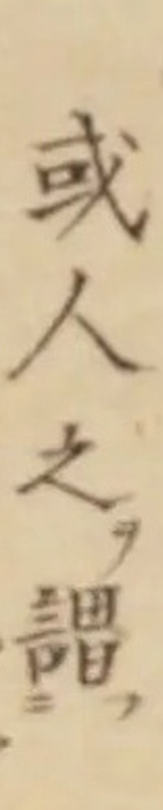或人之ヲ謂フ
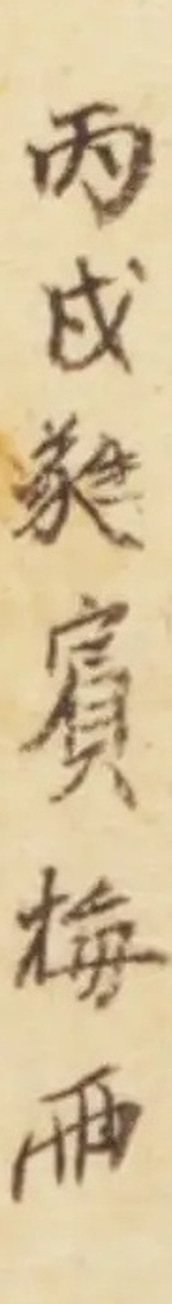丙戌蕤賓梅雨
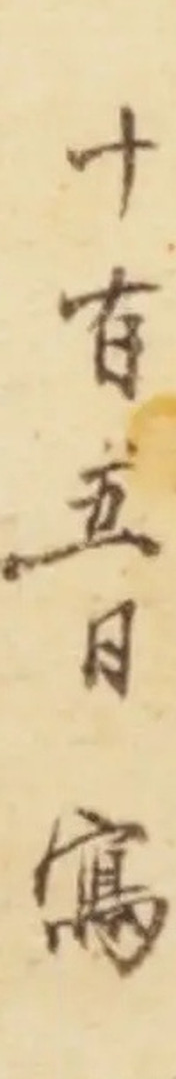十有五日写
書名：梅園草木花譜夏之部. 4
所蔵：国立国会図書館 National Diet Library, JAPAN
